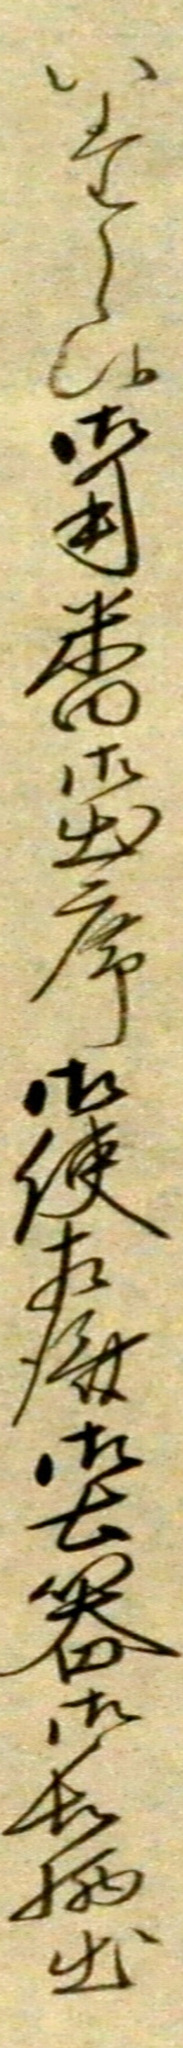いたし候御用番御出席御使相済御土器御長柄出
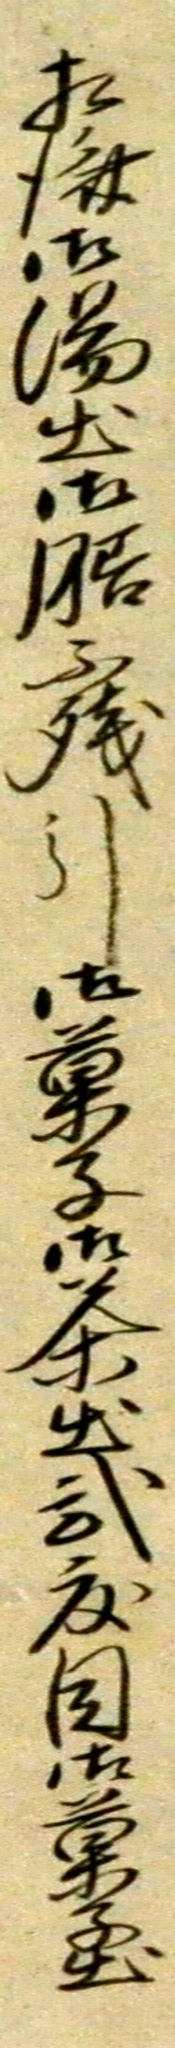相済御湯出御膳不残引御菓子御茶出弍度目御菓子出
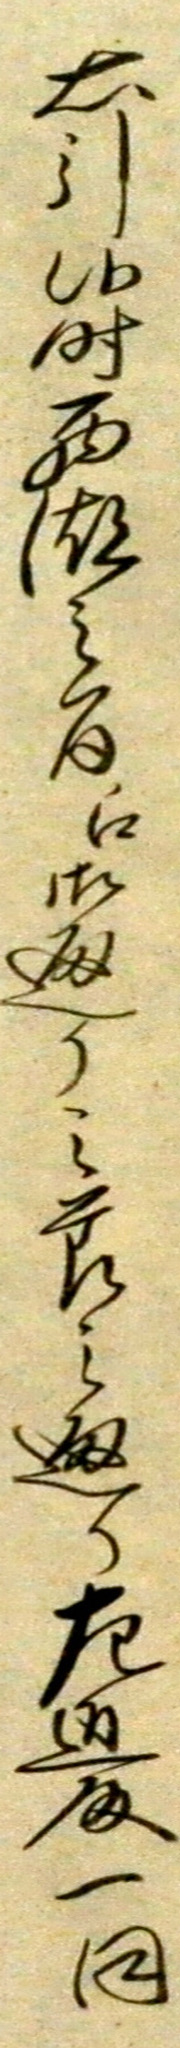右引候時西湖之間え御通り之節之通り左近殿一同
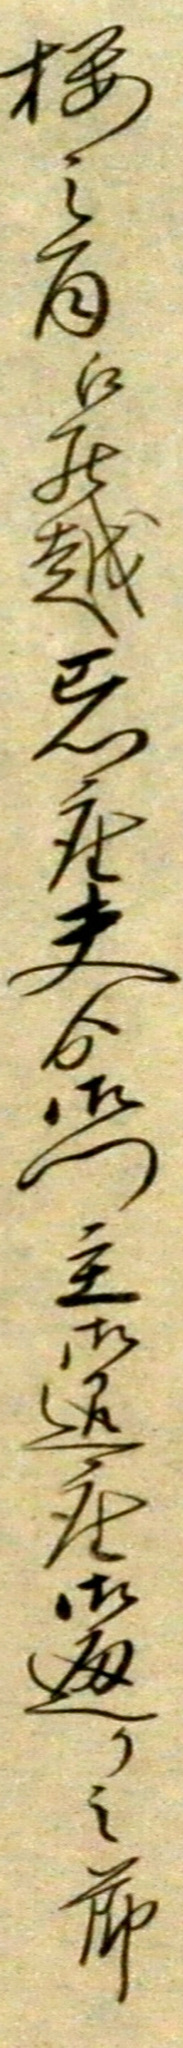桜之間え罷越着座夫ゟ御門主御退座御通り之節
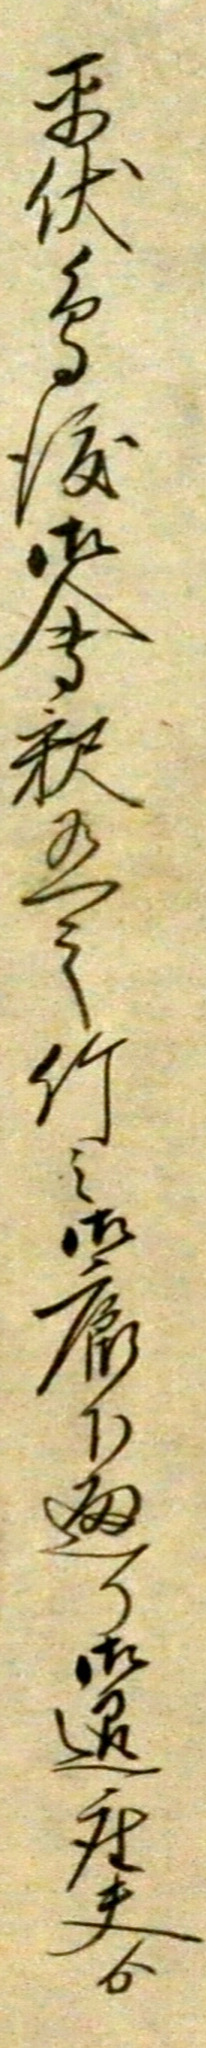平伏鳥渡御会釈有之竹之御廊下通り御退座夫ゟ
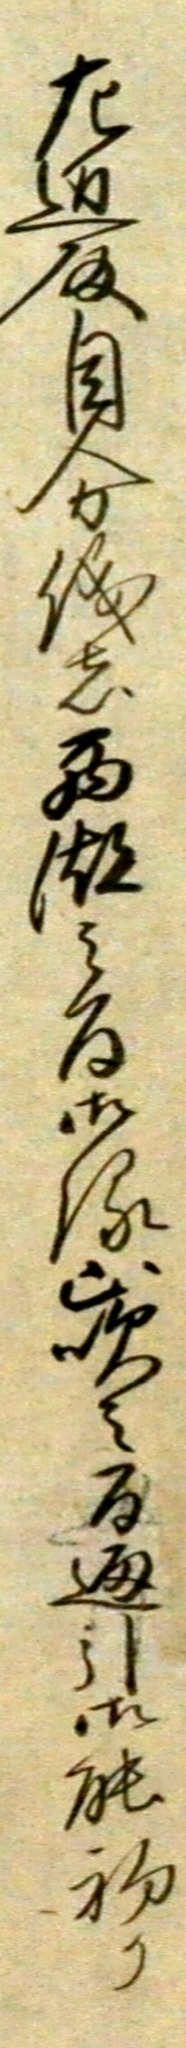左近殿自分儀は西湖之間御縁山吹之間通引御能初り
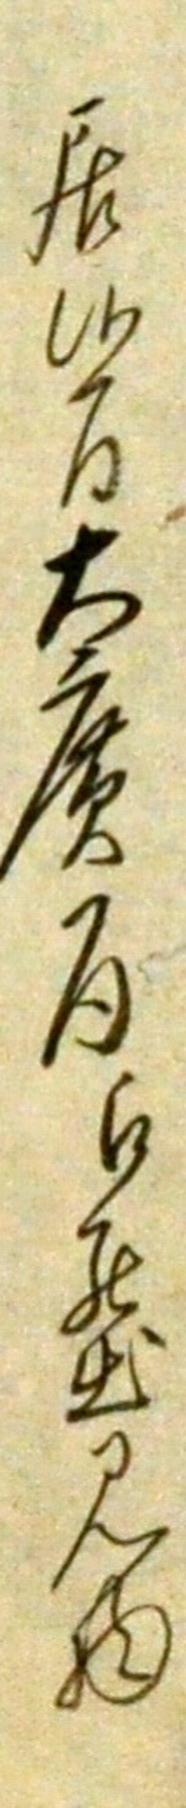居候間大広間え罷出見物
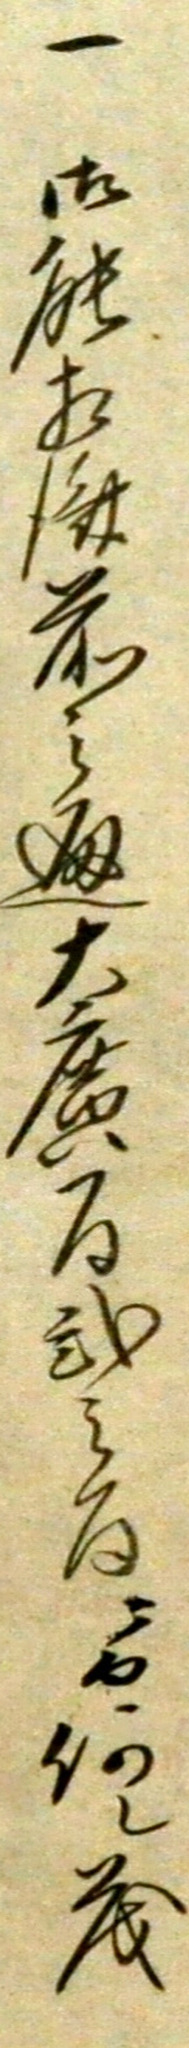一御能相済前之通大広間弍之間ニ而何レも
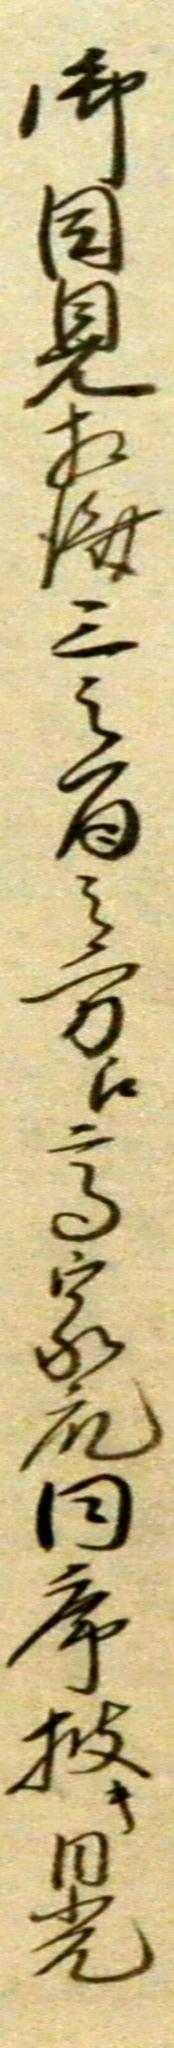御目見相済三之間之方え高家衆同席披キ日光
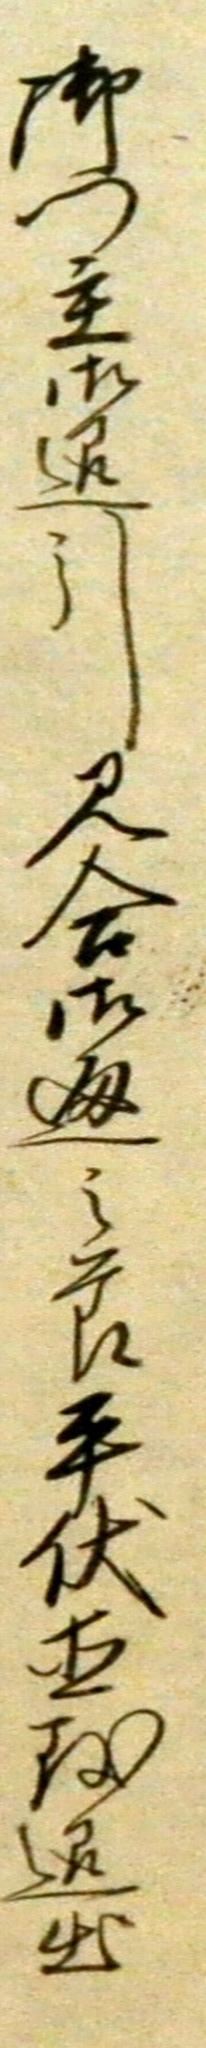御門主御退引見合御通之節平伏直致退出

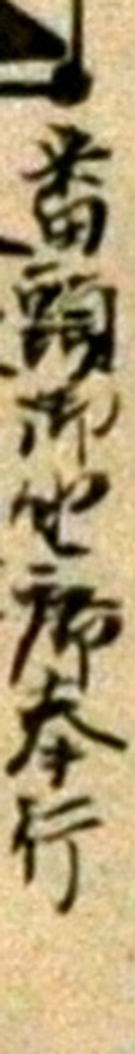▲番頭御坐席奉行
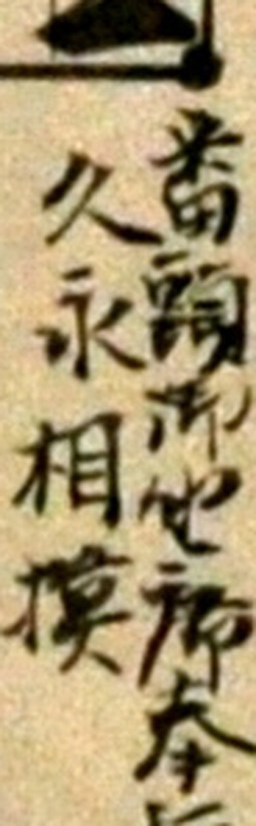久永相模
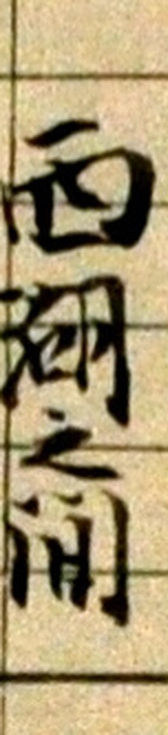西湖之間
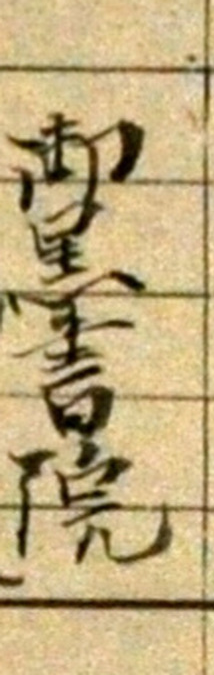御黒書院
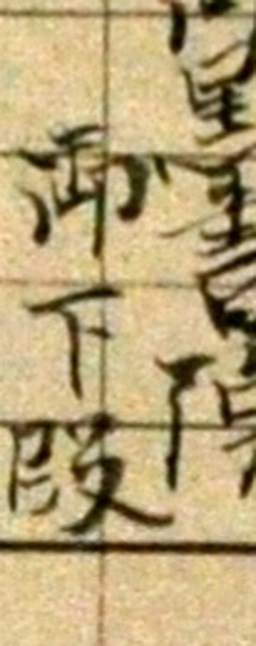御下段
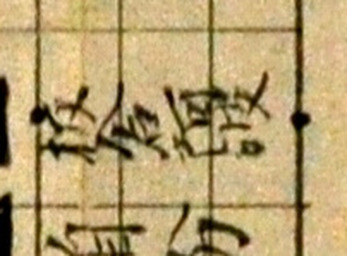▲板倉阿波
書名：右大将様御疱瘡済御能、西湖ノ間御座席奉行勤候節ノ留
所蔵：伊那市立高遠町図書館・合同会社AMANE
